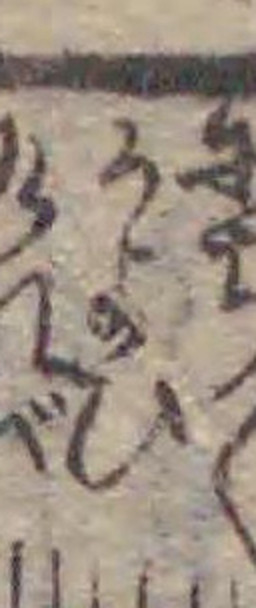ければ
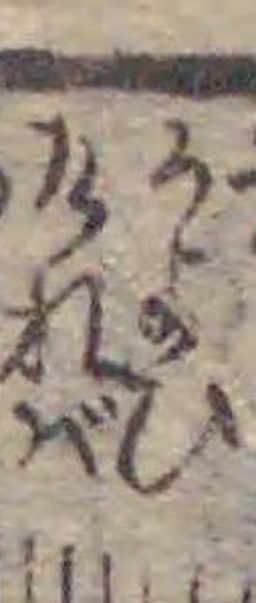ければ
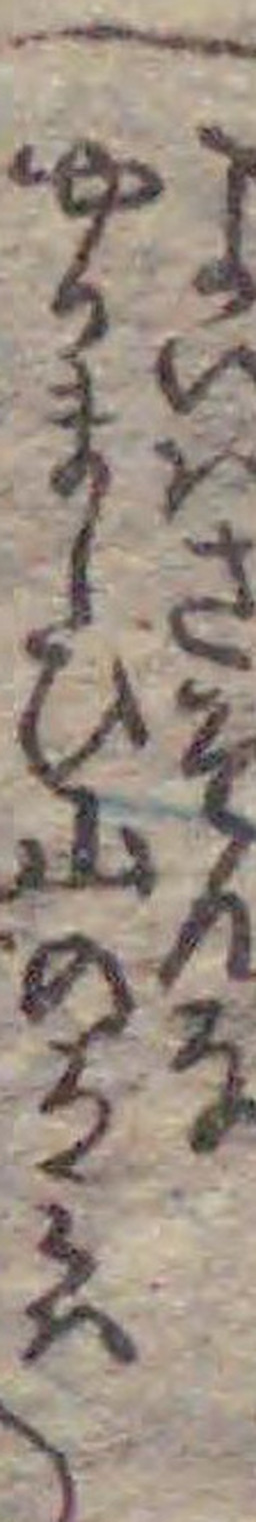やかましひ山のかみは
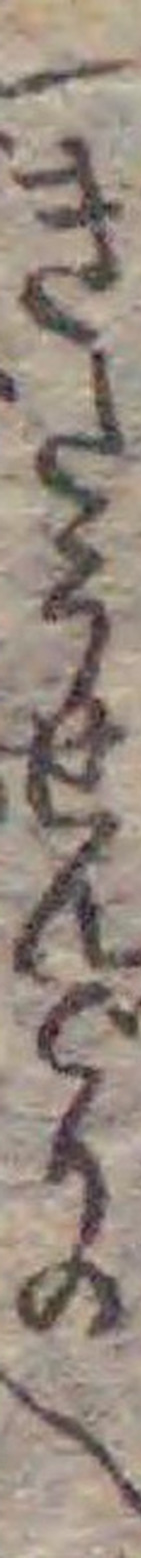きたうせんごりの
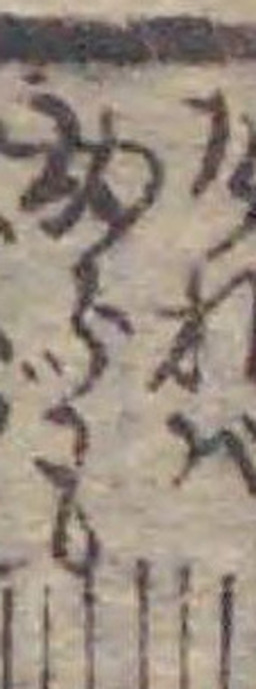女郎も
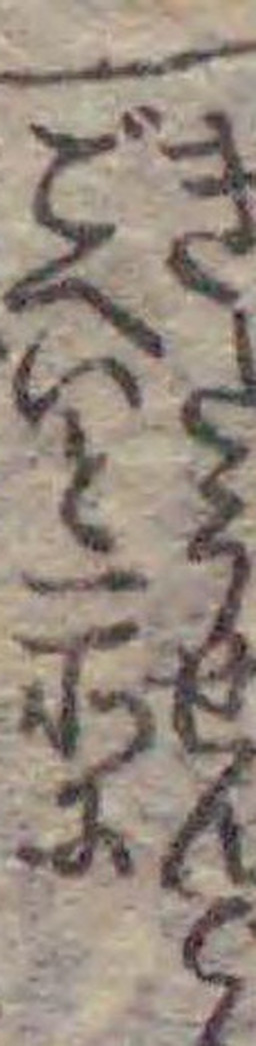ごへいと一所に
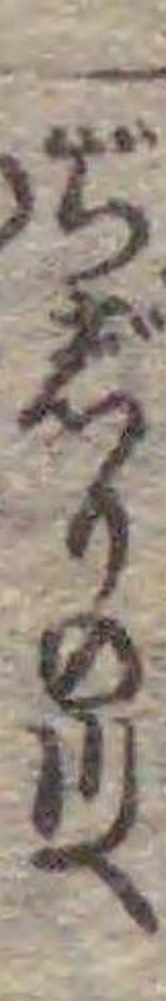ぢじりの川へ
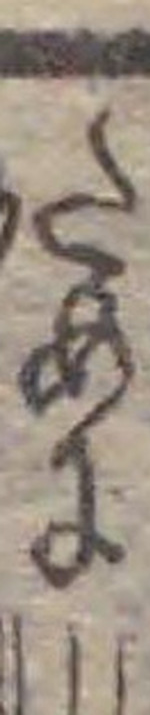ために
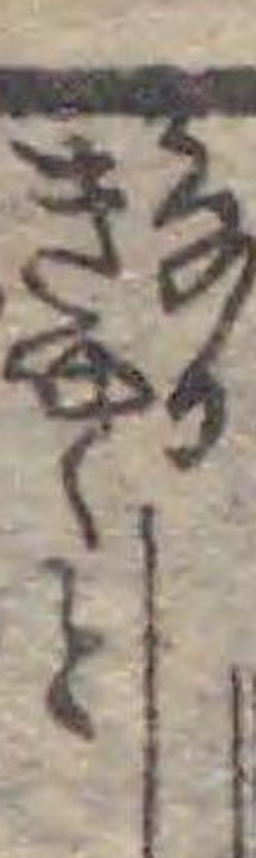きやくと
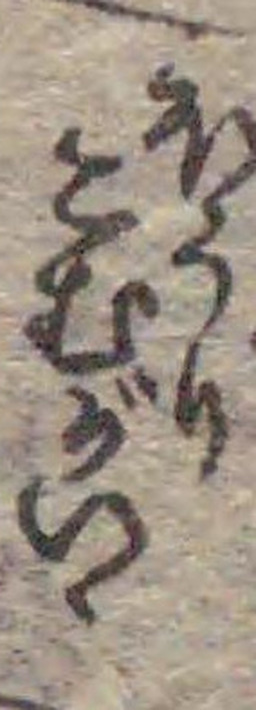こむがいゝ
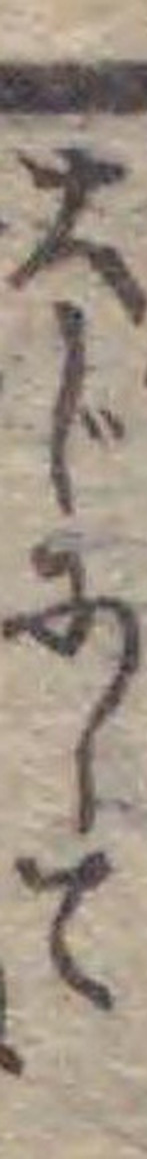大じにして
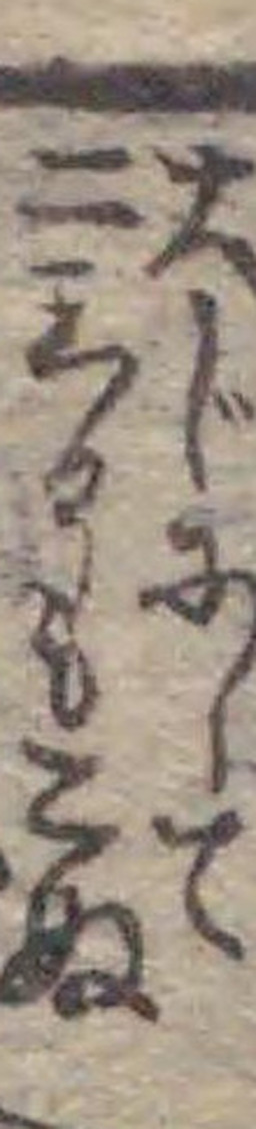二三日もこぬ
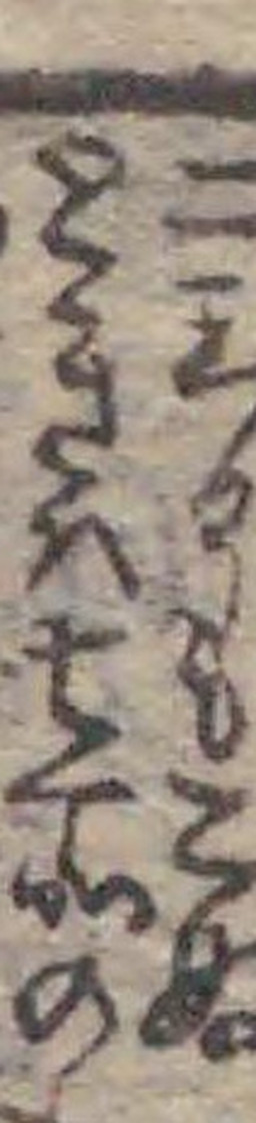ときは七所の
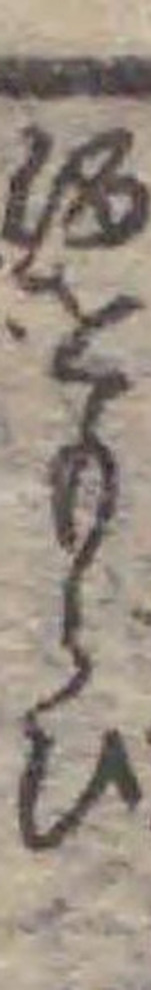酒をもらひ
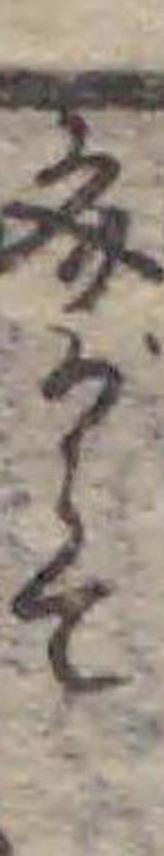文がらて
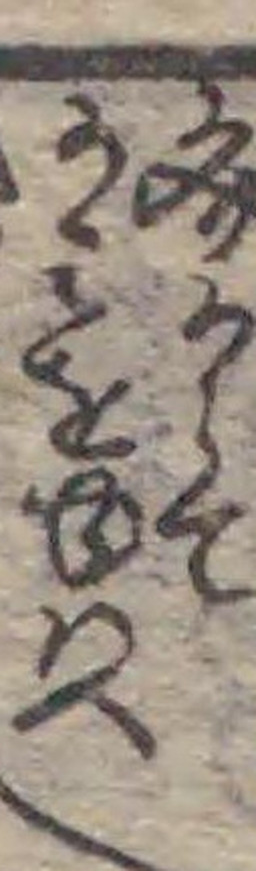かみをゆはへ
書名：四遍搨心学草帋 : 3巻
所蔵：国立国会図書館 National Diet Library, JAPAN
